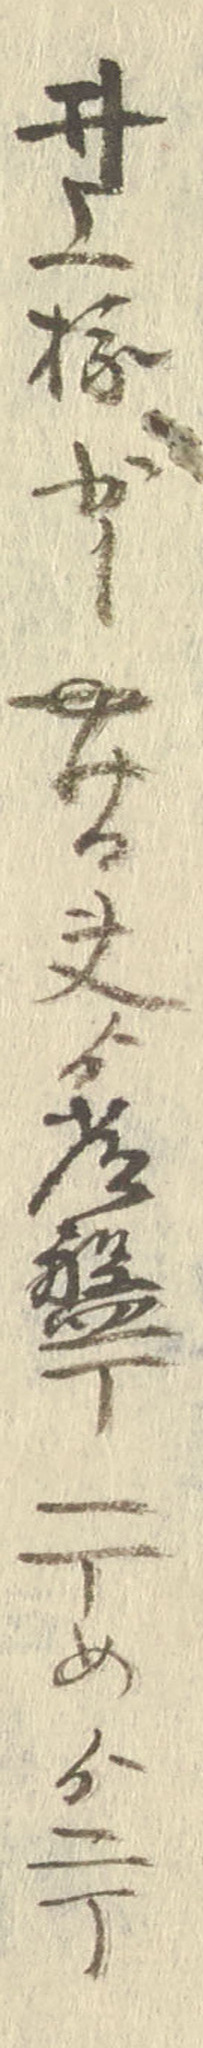井上様少しやける夫ゟ常盤丁一丁めゟ二丁
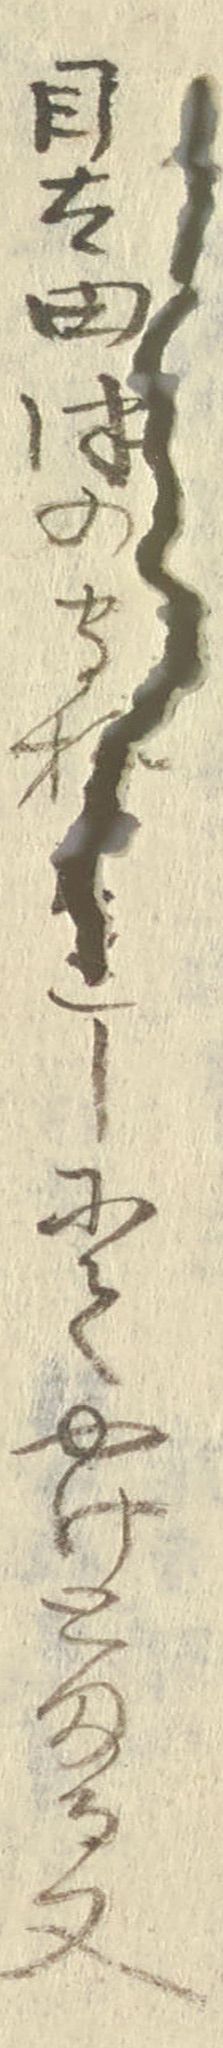目太田津の守様しにてやけとまる又
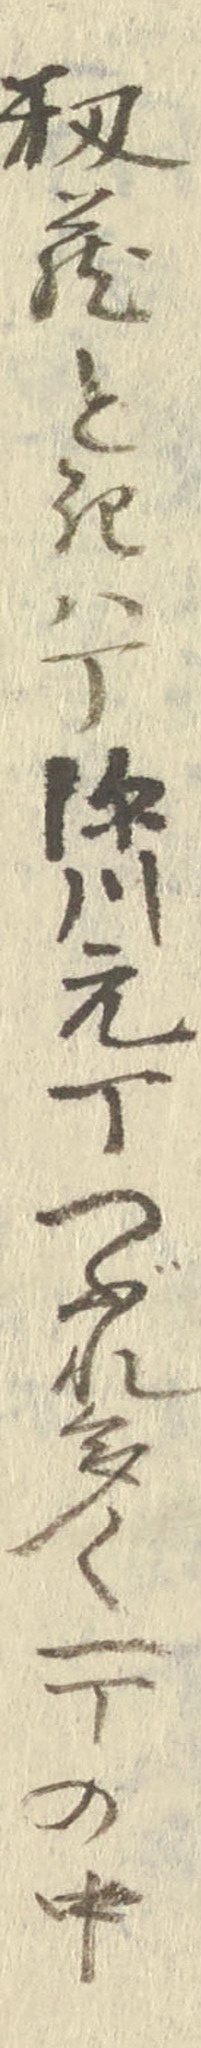籾蔵ときハ丁深川元丁つぶれ多く一丁の中
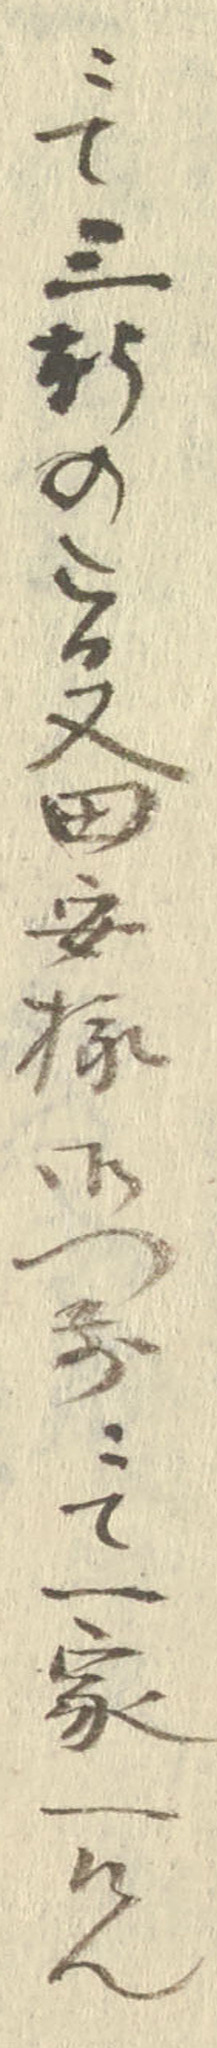ニて三軒のこる又田安様御門前ニて一家一けん
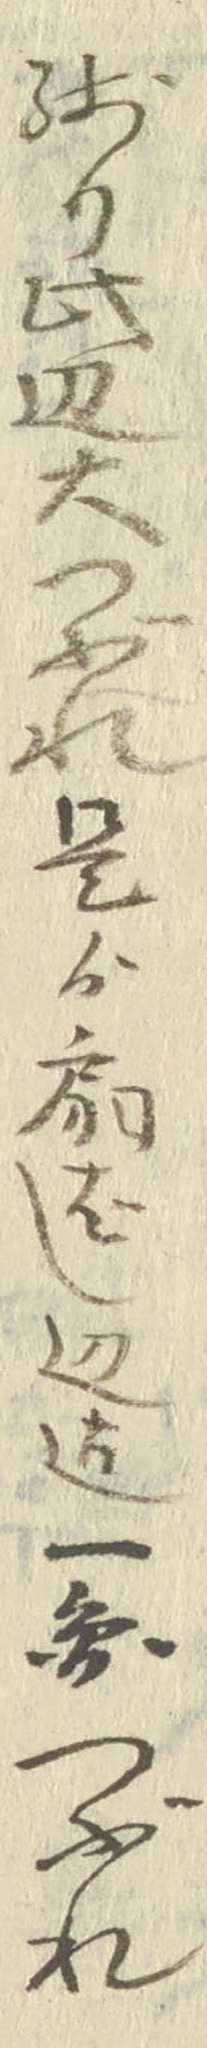残り此辺大つぶれ是ゟ扇ばし辺迄一圓つぶれ
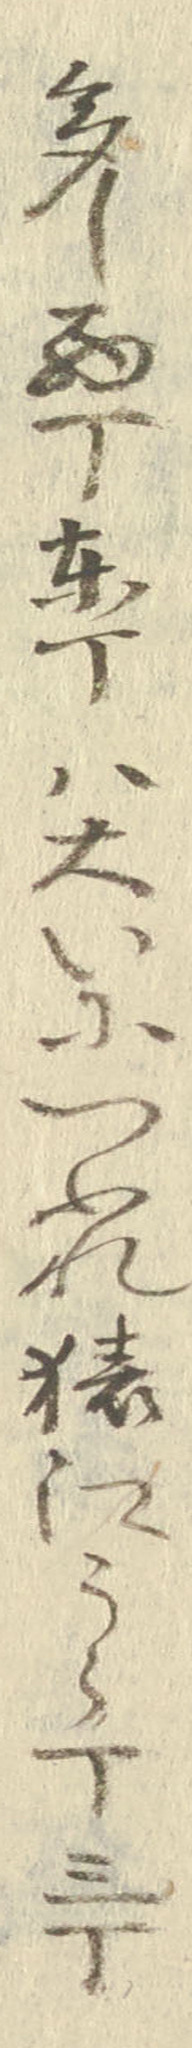多し西丁東丁は大いにつぶれ猿江うら丁三丁
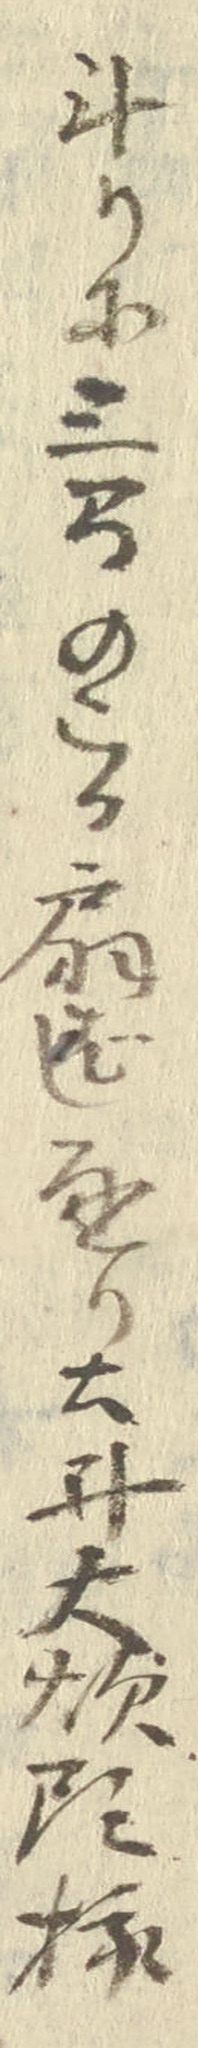斗りに三間のこる扇ばし通り土井大炊頭様
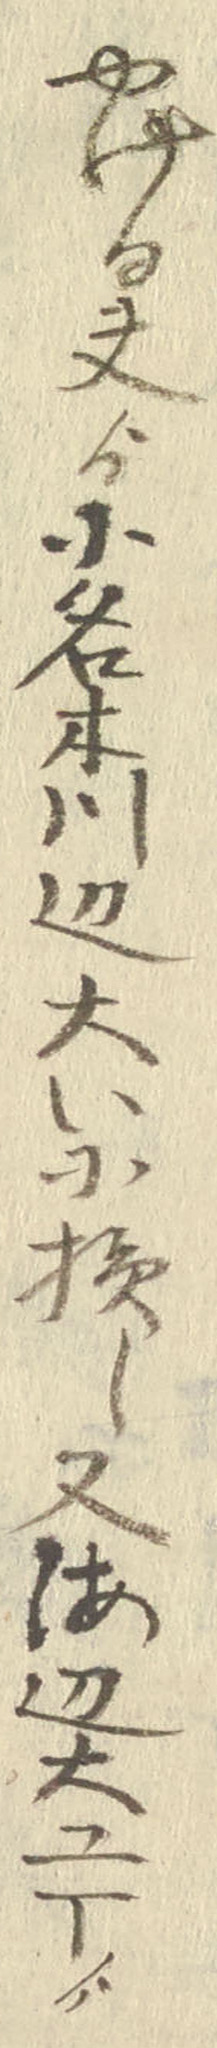やける夫ゟ小名木川辺大いに損し又海辺大工丁ゟ
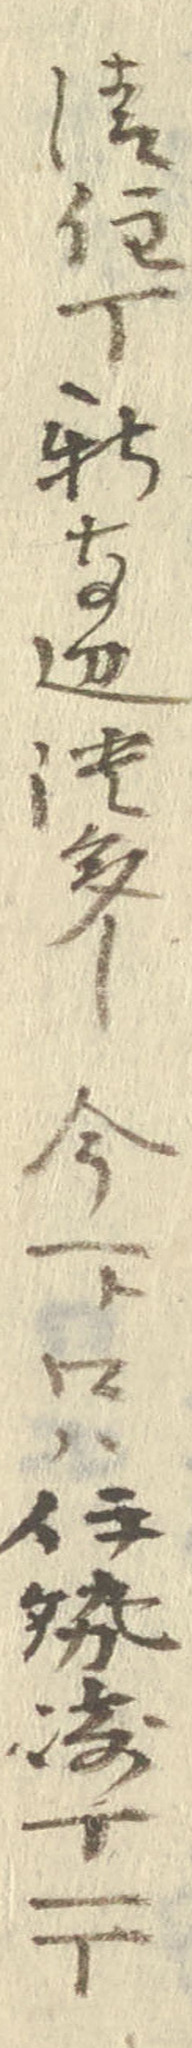清住丁新寺辺潰多し今一ト口は伊勢崎丁一丁
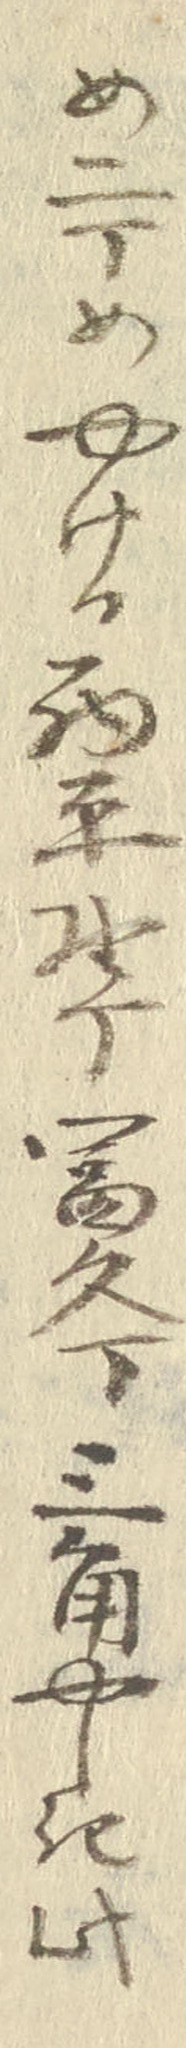め二丁めやける西平野丁富久丁三角やき此
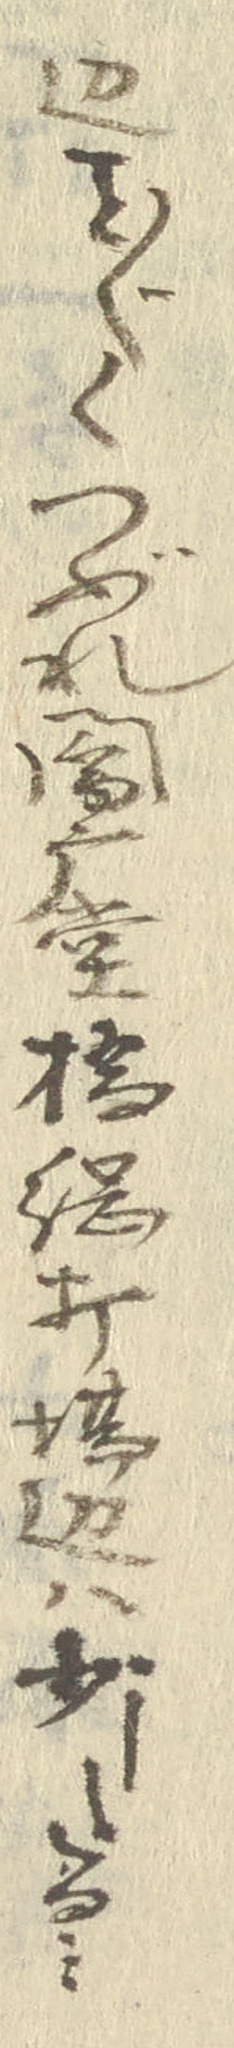辺こと〴〵くつぶれ閻魔堂橋網打場辺は少したるみ
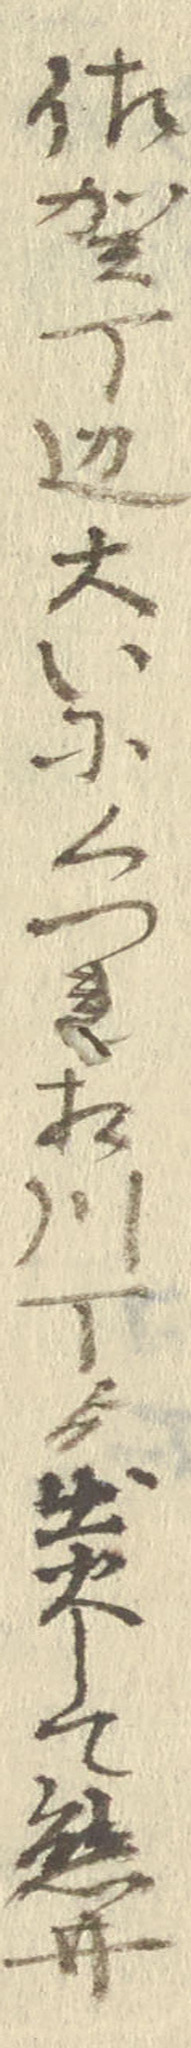佐賀丁辺大いにくつれ相川丁ゟ出火して熊井
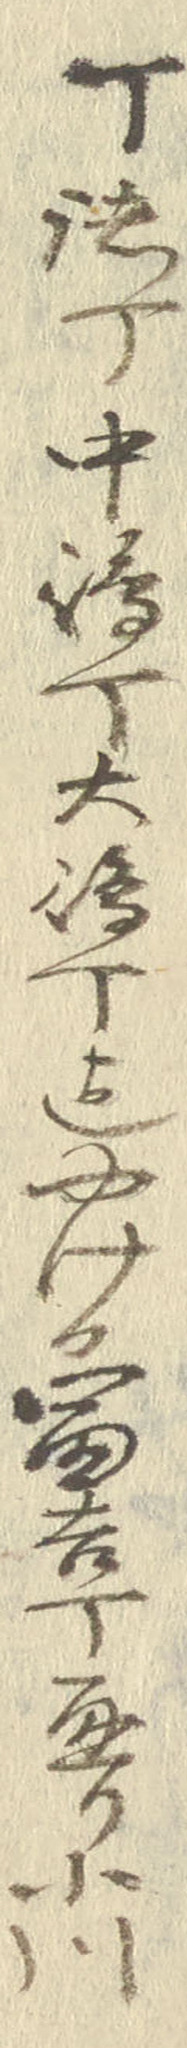丁諸丁中嶋丁大嶋丁迄やける富吉丁通り小川
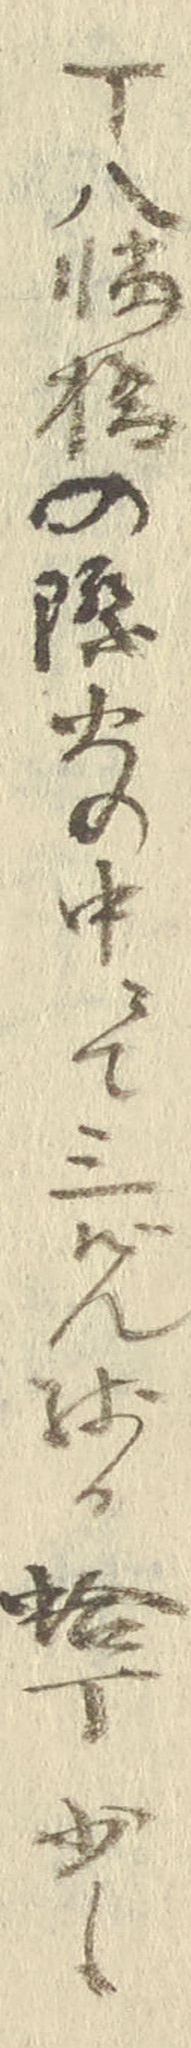丁八幡橋の際火の中ニて三げん残る蛤丁少し
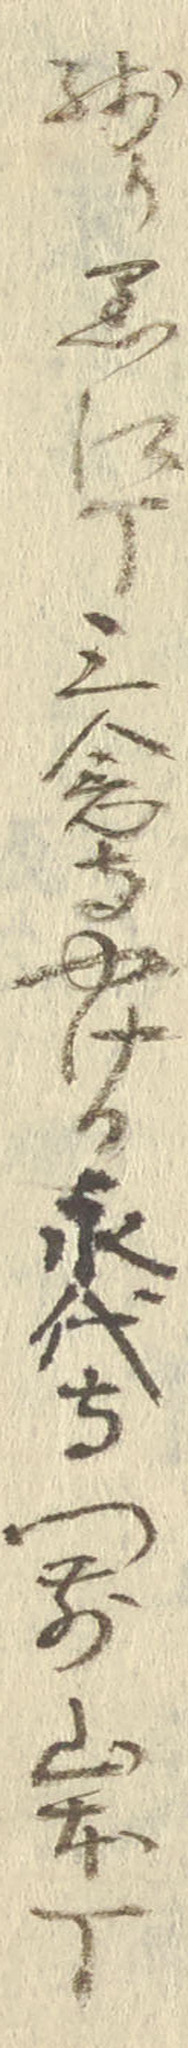残り黒江丁三念寺やける永代寺門前山本丁
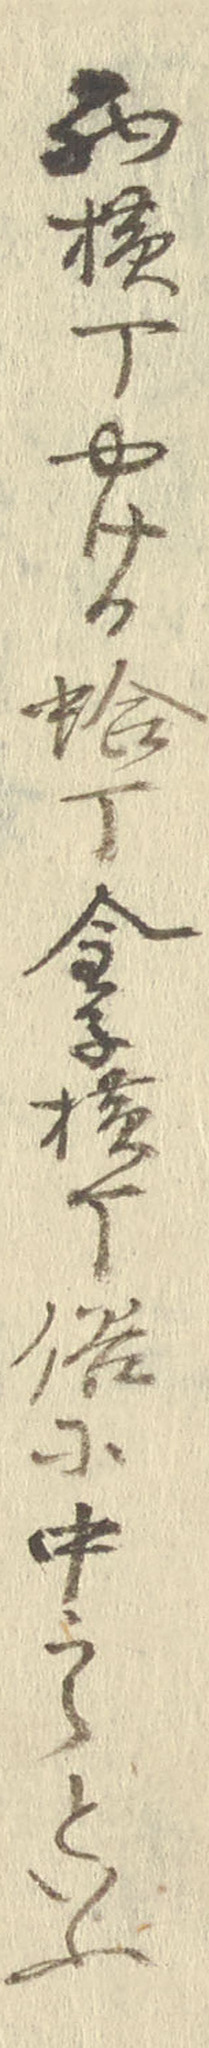西横丁やける蛤丁金子横丁俗に中うらといふ
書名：御府内御屋敷方市中共地震類焼場所明細書之冩兼街道筋近郷聞書
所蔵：東京大学総合図書館 General Library in the University of Tokyo, JAPAN
